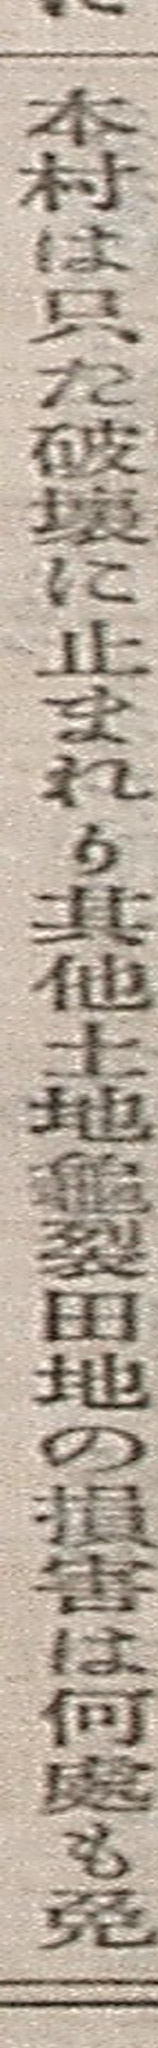本村は只た破壊に止まれり其他土地亀裂田地の損害は何処も免
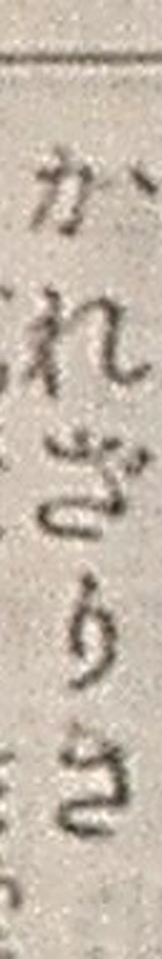かれざりき
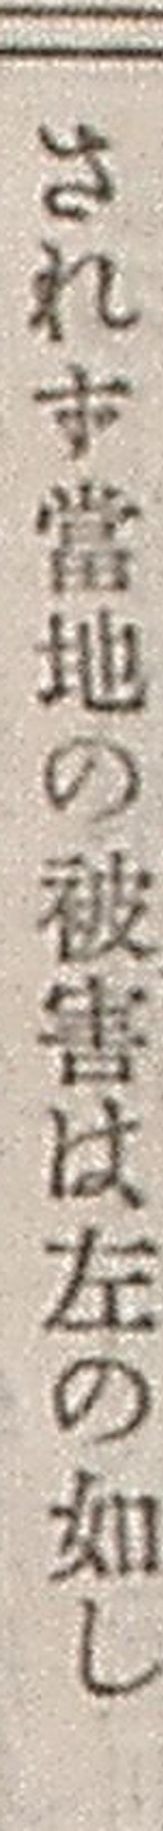されず当地の被害は左の如し
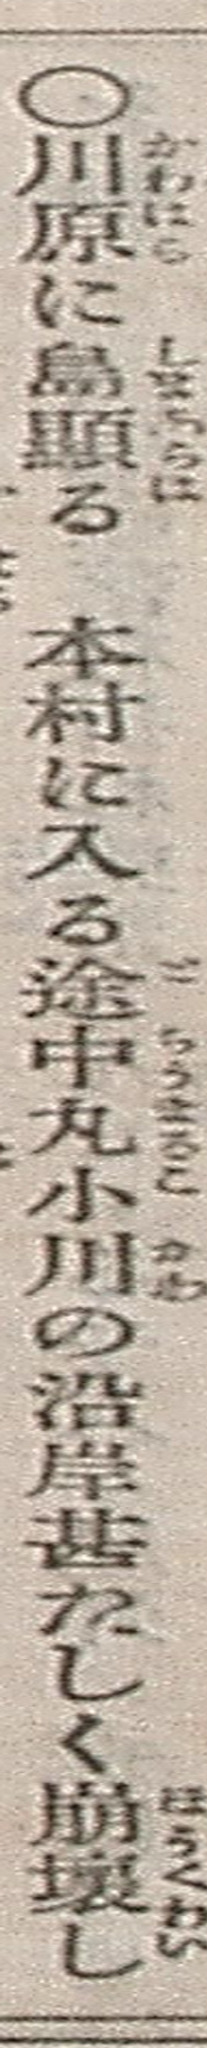〇川原に島顕る本村に入る途中丸小川の沿岸甚たしく崩壊し
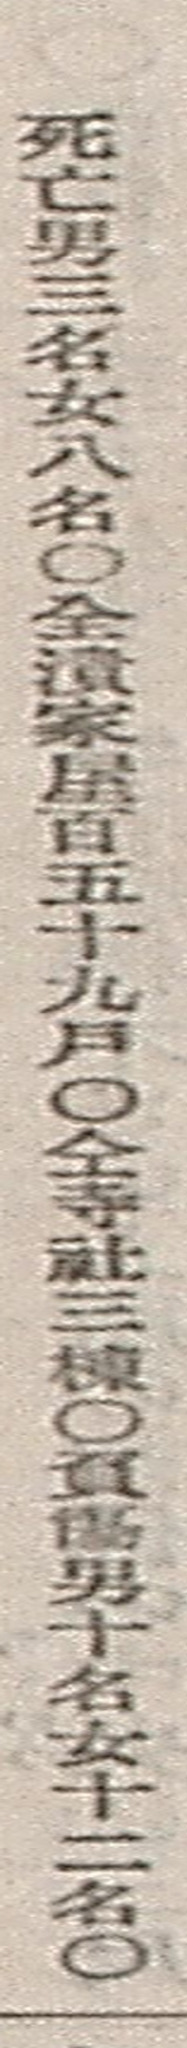死亡男三名女八名〇全潰家屋百五十九戸〇仝寺社三棟〇負傷男十名女十二名〇
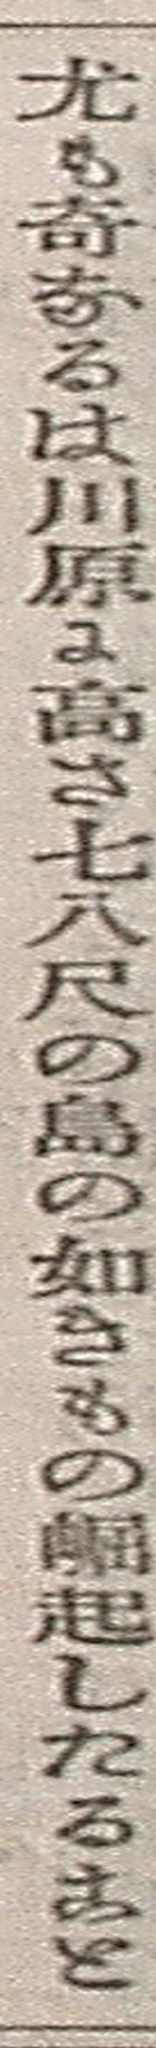尤も奇なるは川原に高さ七八尺の島の如きもの崛起したること
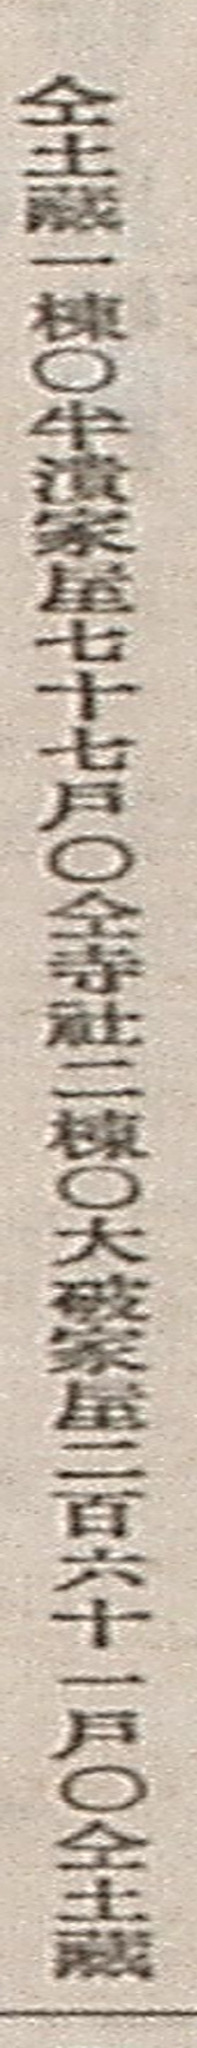仝土蔵一棟〇半潰家屋七十七戸〇仝寺社ニ棟〇大破家屋二百六十一戸〇仝土蔵
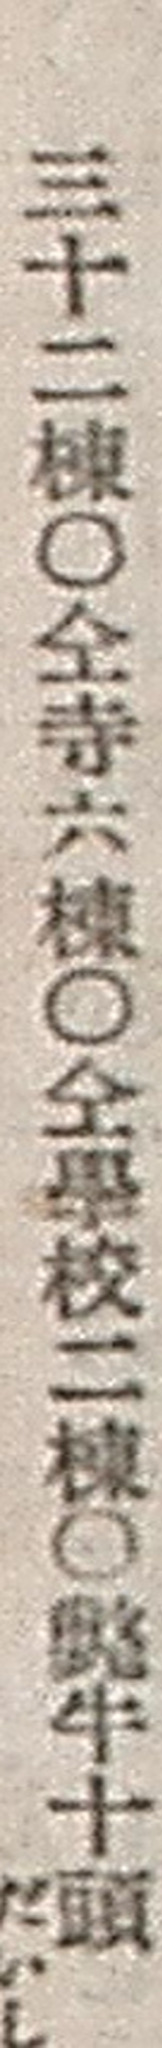三十二棟〇仝寺六棟〇仝学校ニ棟〇屍牛十頭
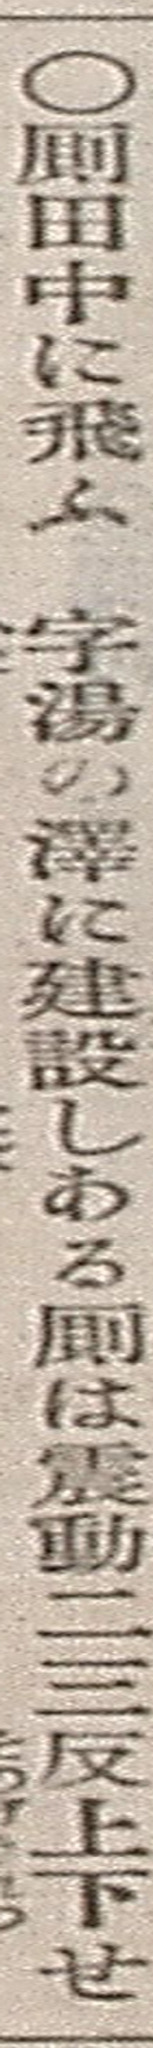〇厠田中に飛ふ字湯の沢に建設しある厠は震動二三反上下せ
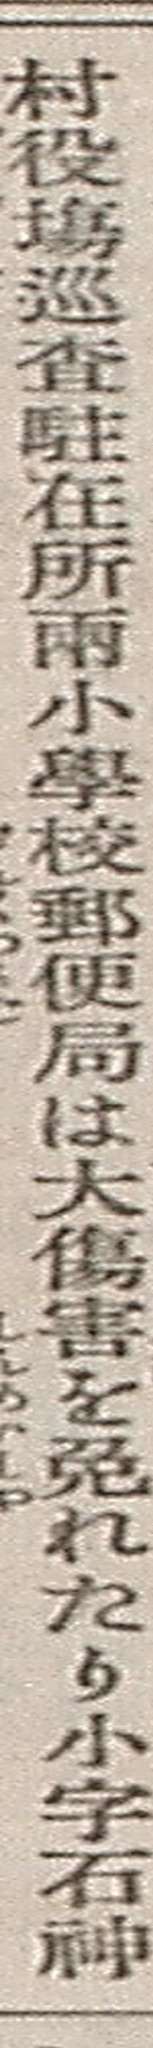村役場巡査駐在所両小学校郵便局は大傷害を免れたり小字石神
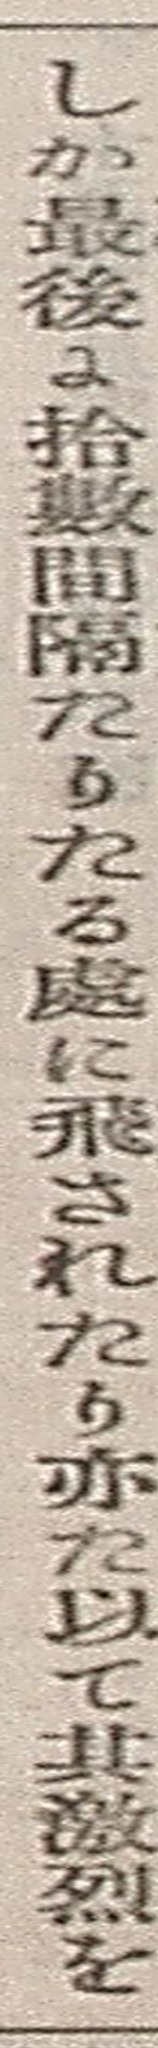しか最後に拾数間隔たりたる処に飛されたり亦た以て其激烈を
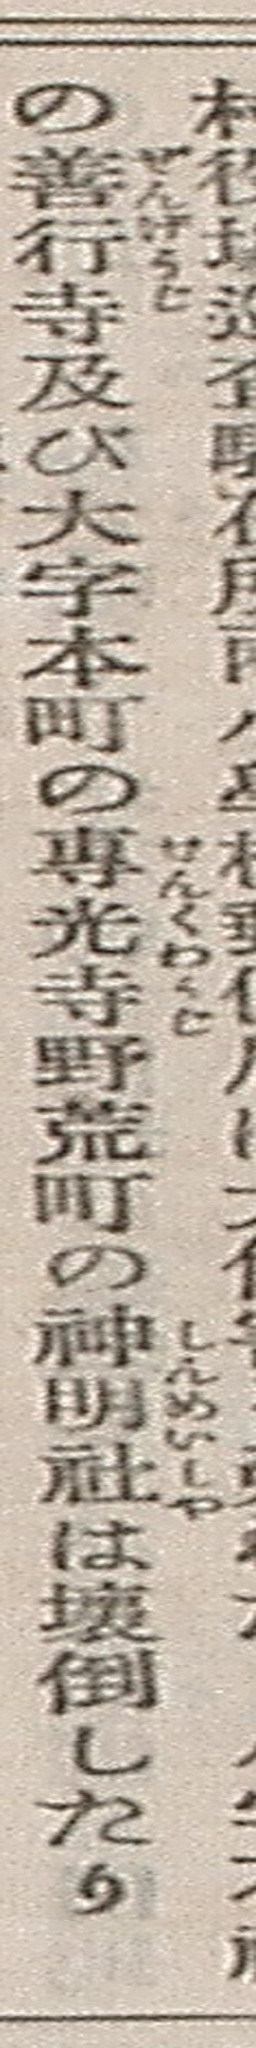の善行寺及び大字本町の専光寺野荒町の神明社は壊倒したり
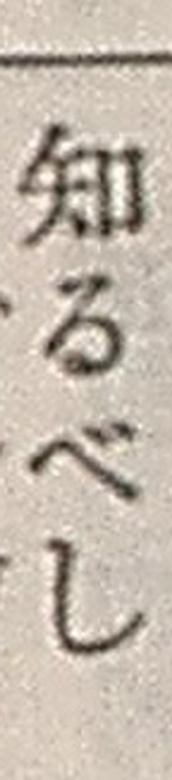知るべし
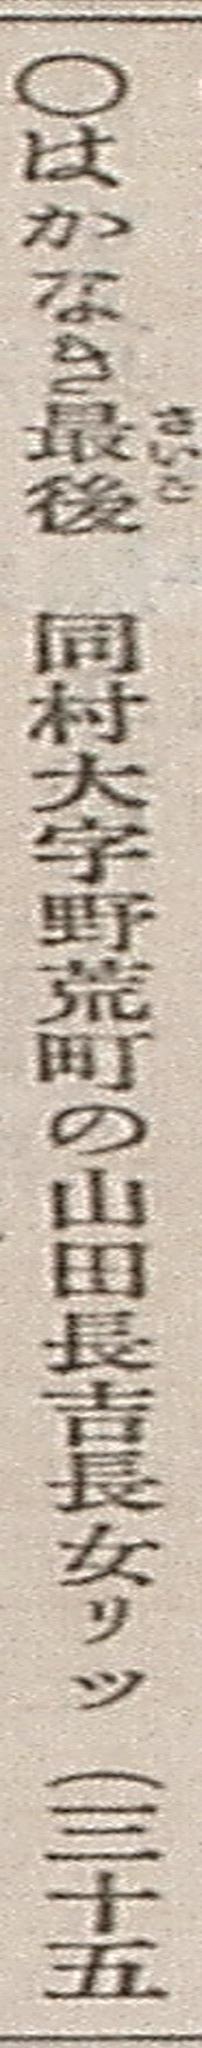〇はかなき最後同村大字野荒町の山田長吉長女リツ（三十五
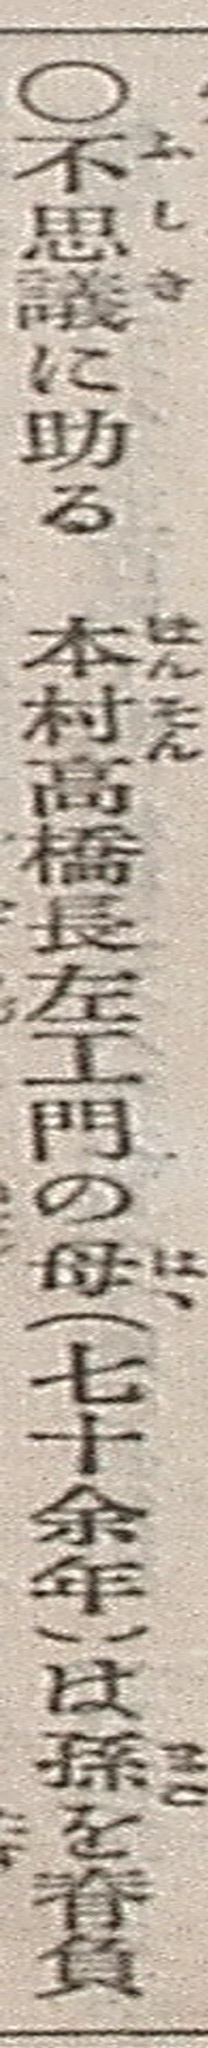〇不思議に助る本村高橋長左エ門の母は孫を脊負
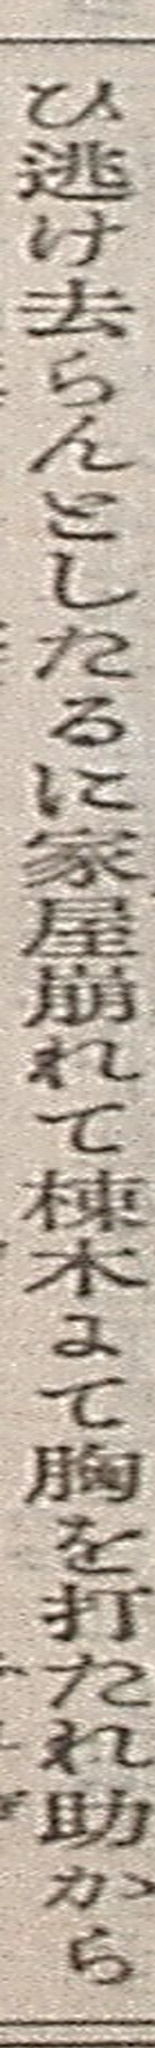ひ逃け去らんとしたるに家屋崩れて棟木にて胸を打たれ助から
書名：風俗畫報臨時増刊第百二十四號　洪水地震被害録（上）
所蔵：東京大学地震研究所図書室 Earthquake Research Institute Library, The University of Tokyo, JAPAN
